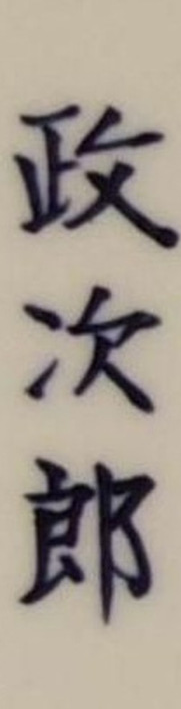政次郎
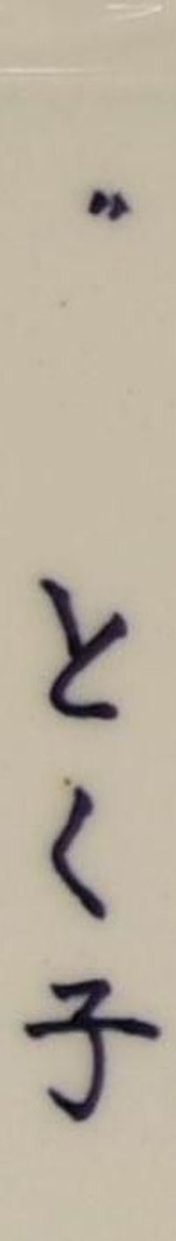とく子
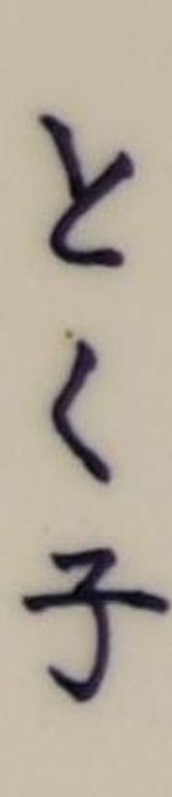とく子

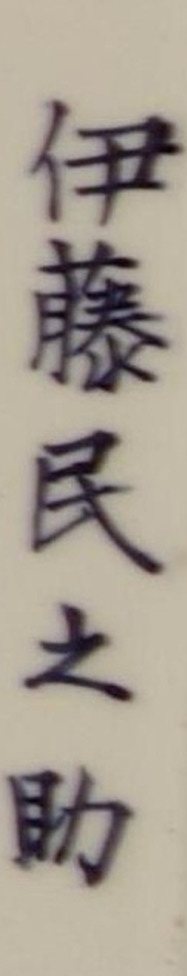伊藤民之助
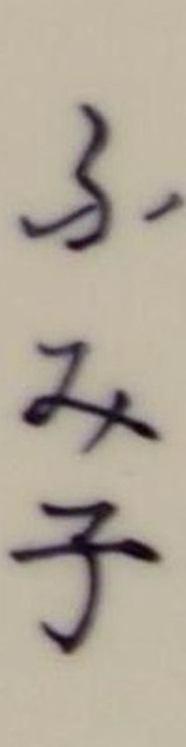ふみ子
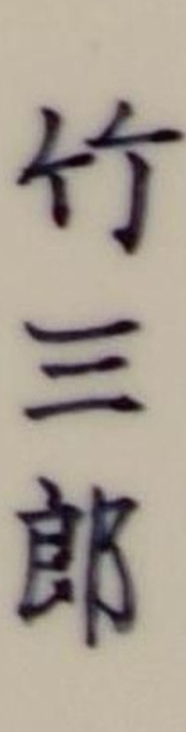竹三郎
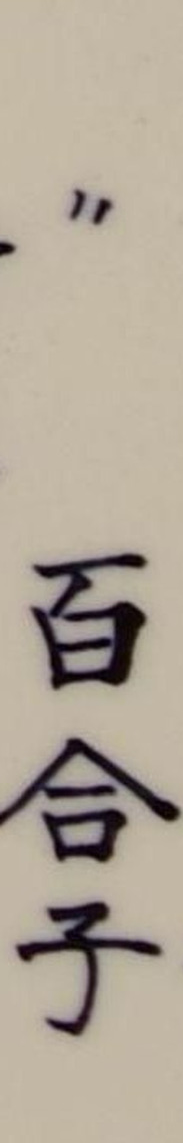百合子
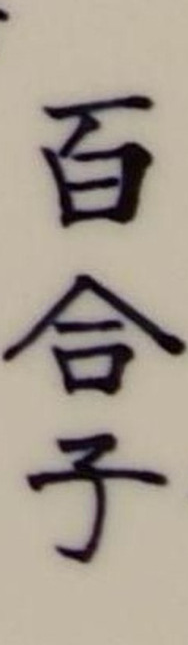百合子
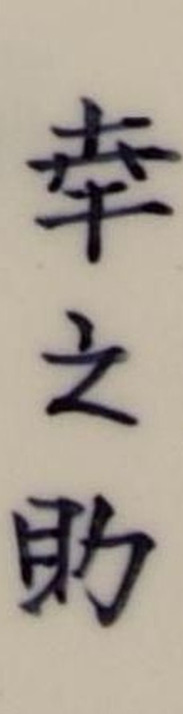幸之助
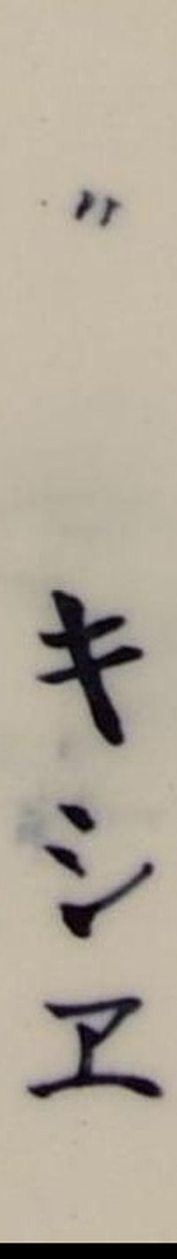キシエ
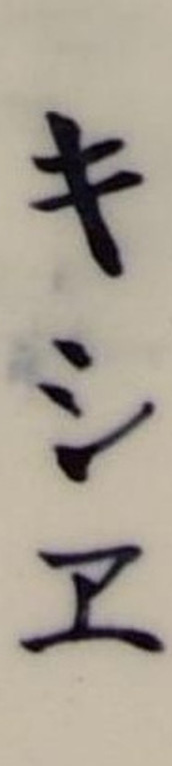キシエ

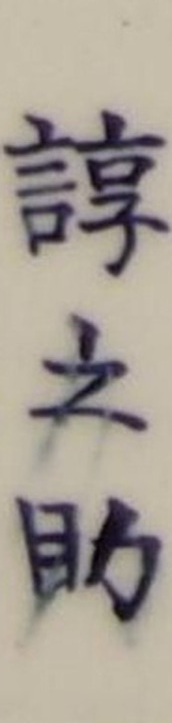諄之助
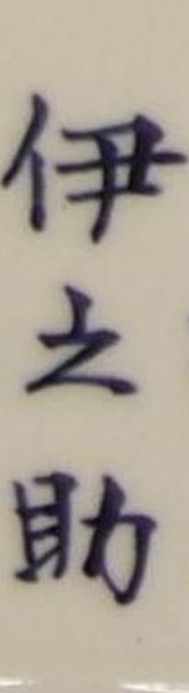伊之助

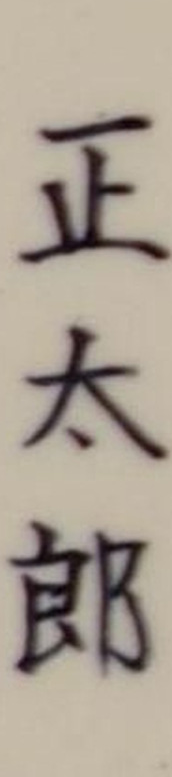正太郎
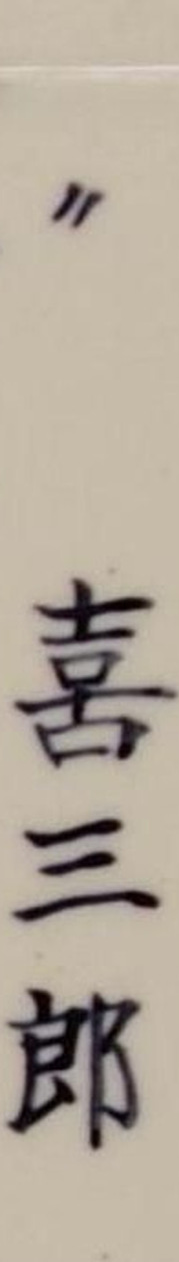喜三郎
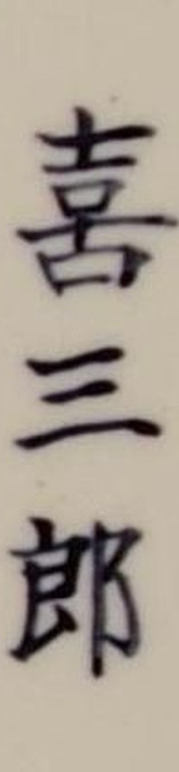喜三郎
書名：M~S
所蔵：高野山金剛峯寺
